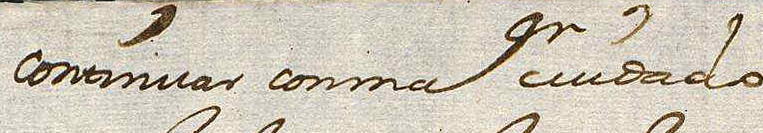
continuar con maor cuidado
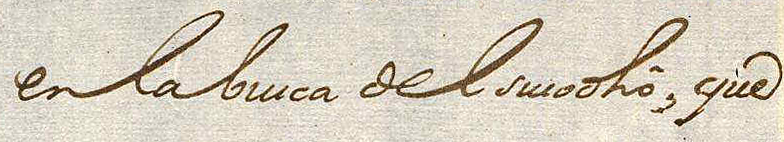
en la busca del susodhō, que
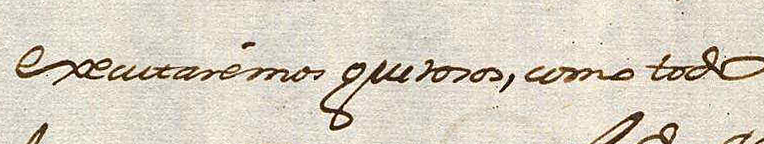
executarémos gustosos, como todo
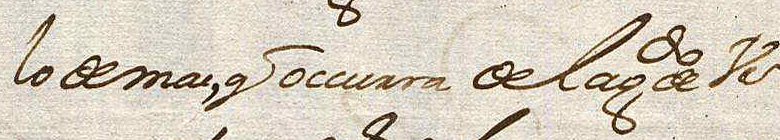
lo demas, q̄ occurra del agdo de Vs
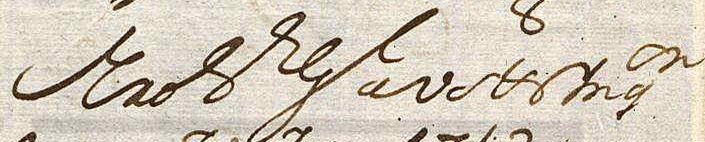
Nro Sor Ge a vs & Ynqon
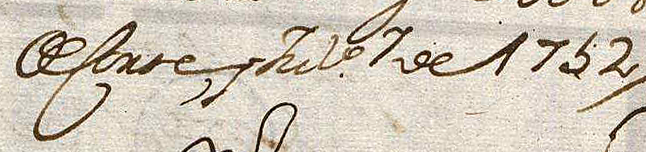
de Corte, y Iul.o 7 de 1752
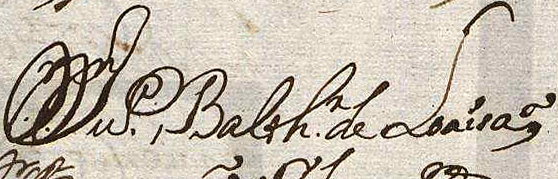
Dn Ju.o Balth.r de Loaisa
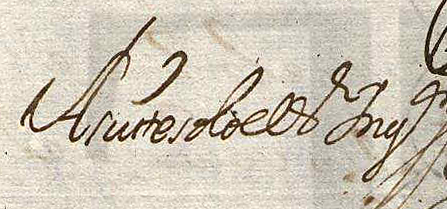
Assiste solo el sor Ynqr
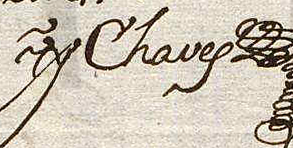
y Chaves
